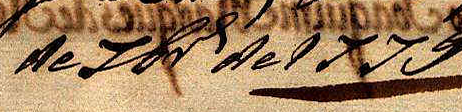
de 7br.o de i779
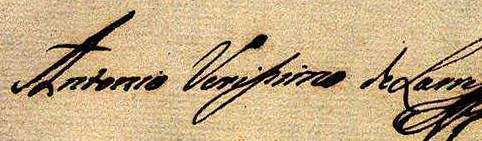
Antonio Verissimo de Larre
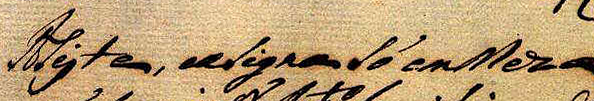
Asejte, e asigna só em Meza
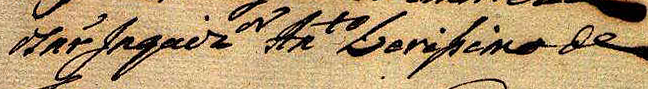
o snr̄ Jnquizor Anto Verissimo de
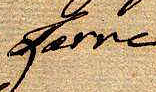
Larre
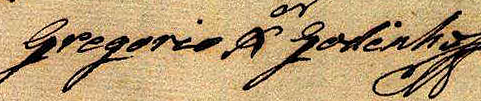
Gregorio xer godinho
